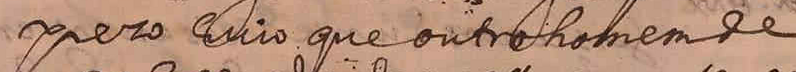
prezo E uio que outro homem de
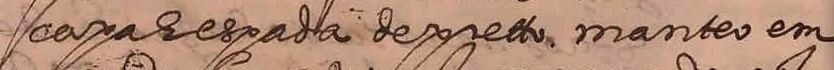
capa E espada de pretto manteo em
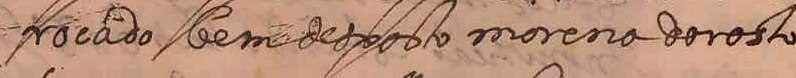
roçado bem desposto moreno do rosto
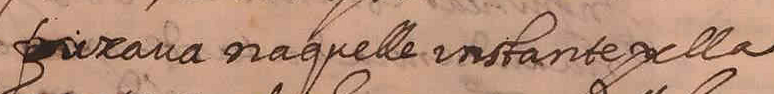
puxaua naquelle instante pella
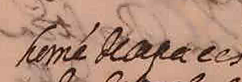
homē de capa e es
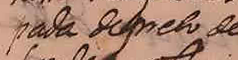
pada de preto de
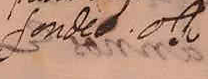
fende o R.
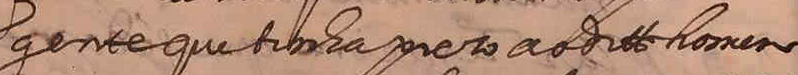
gente que tinha prezo ao ditto homem
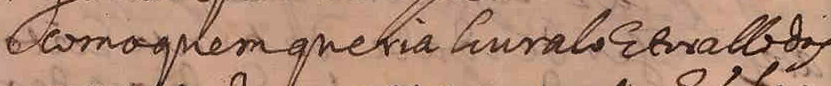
com a quem queria liuralo E tirallo das
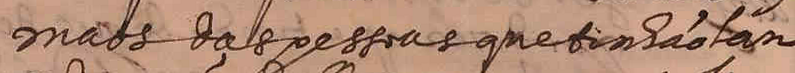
maos das pessoas que tinhaõ lan
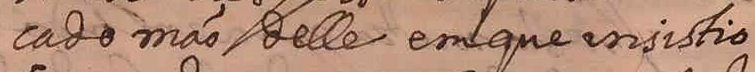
çado maõ delle em que insistio
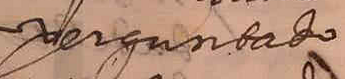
perguntado
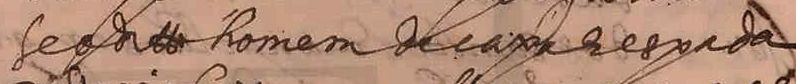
se o ditto homem de caxa E espada
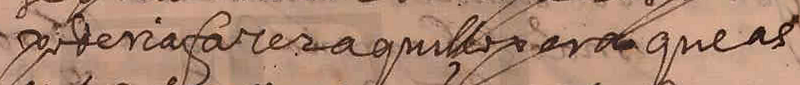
poderia fazer aquillo para que as
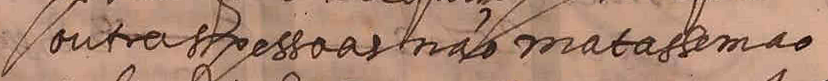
outras pessoas naõ matassem ao
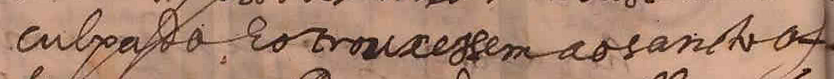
culpado E o trouxessem ao sancto of
